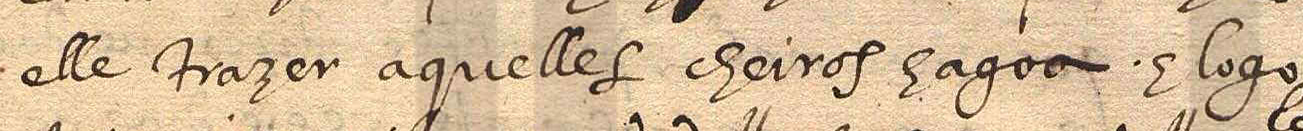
elle trazer aquelles cheiros E agoa. E logo
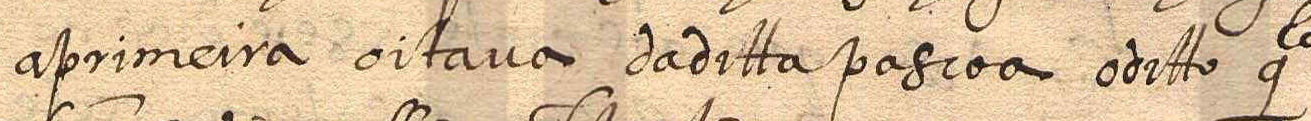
a primeira oitaua da ditta pascoa o ditto gco
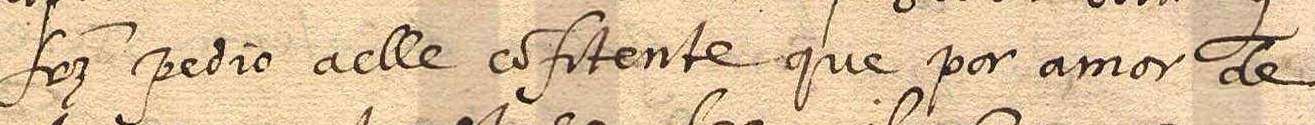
frz̄ pedio a elle cōfitente que por amor de
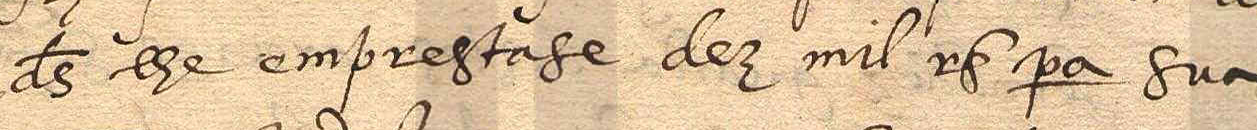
d̄s lhe emprestase dez mil rs̄ ꝑa sua
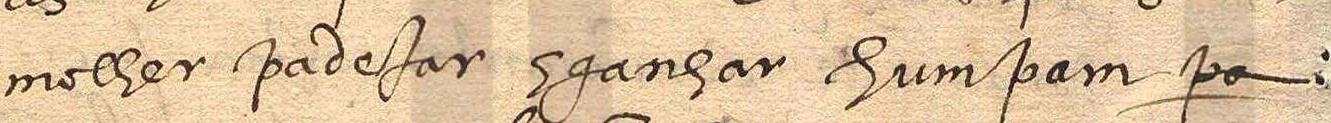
molher padeJar E ganhar hum pam ꝑa
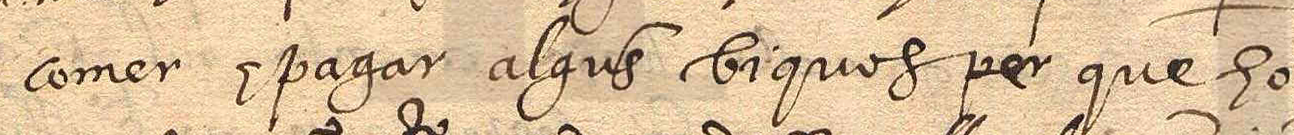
comer E pagar algūs biquos per que ho
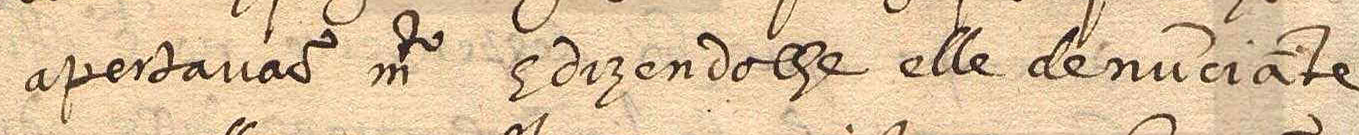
apertauaõ mto E dizendolhe elle denūciāte
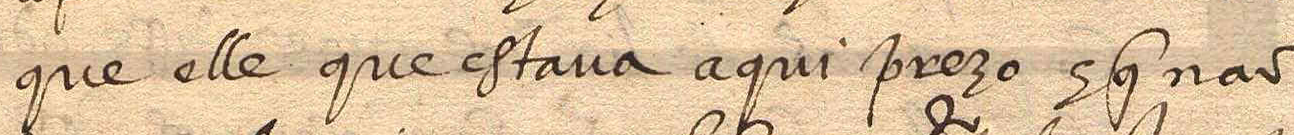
que elle que estaua aqui prezo E q̄ naõ
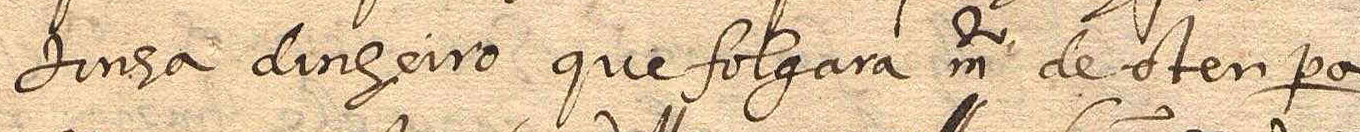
tinha dinheiro que folgara mto de o ter ꝑa
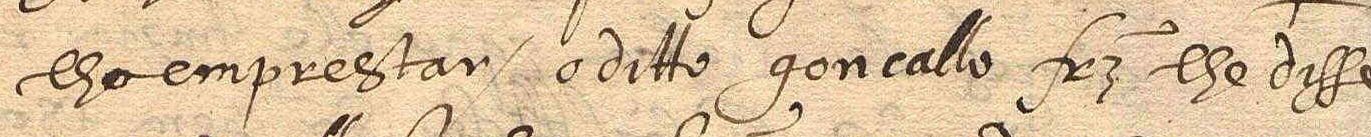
lho emprestar / o ditto gonçallo frz̄ lhe disse
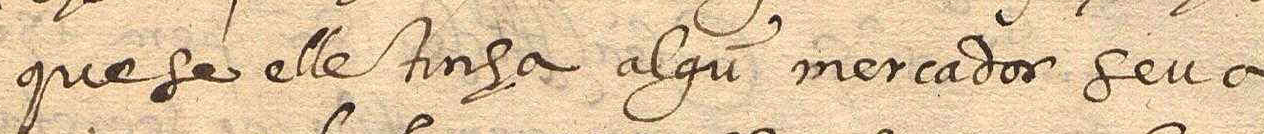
que se elle tinha algū mercador seu a
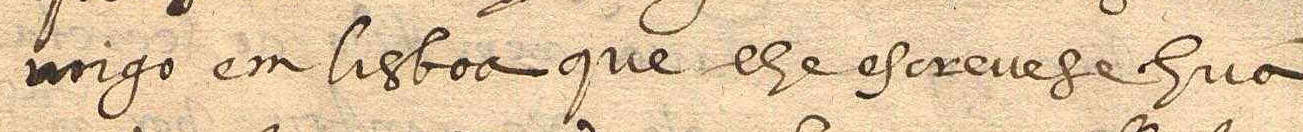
migo em lisboa que lhe escreuese huā
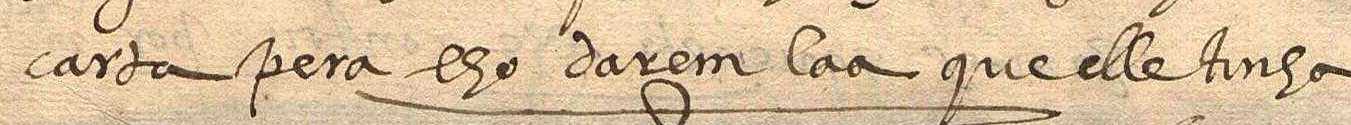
carta pera lho darem laa que elle tinha
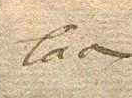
laa
